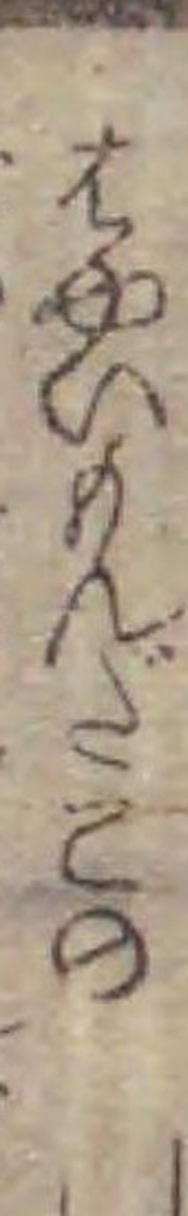はやいもんだこの
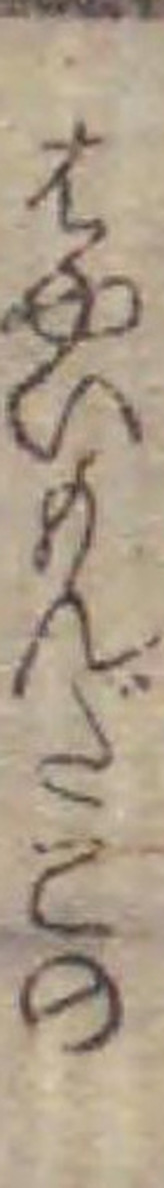はやいもんだこの
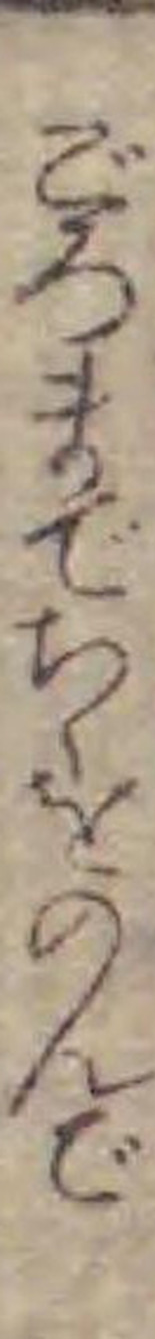ごろまでちゝをのんで
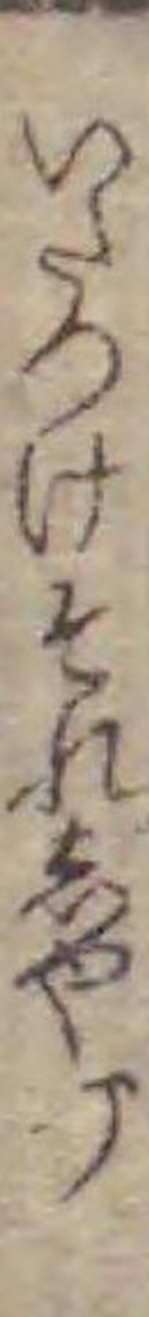いたつけそれじやア
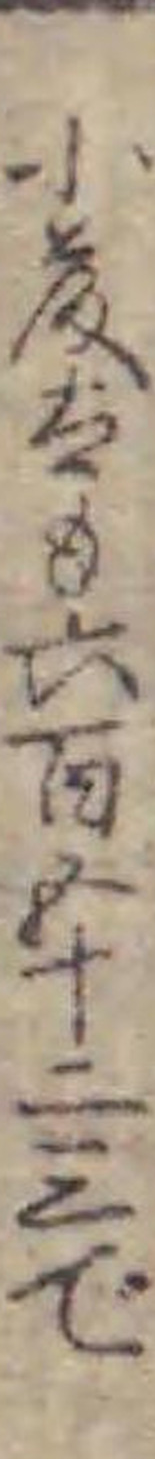小藤太も六百五十二三で
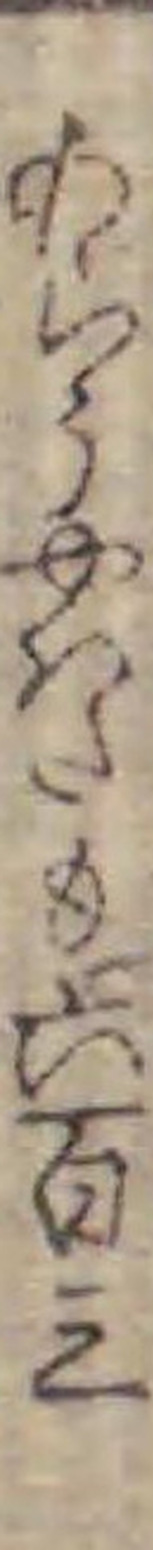あらうやはたも六百三
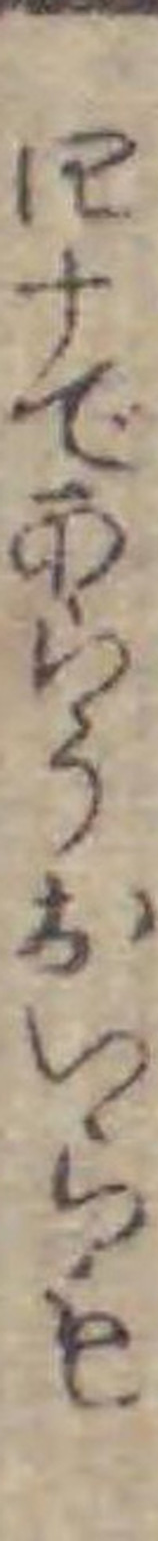四十であらうおいらも
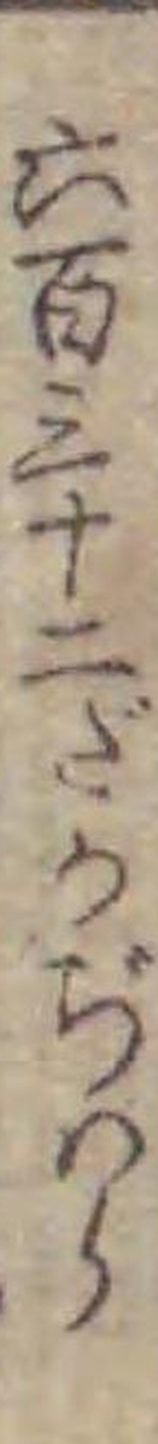六百三十二だかぢはら
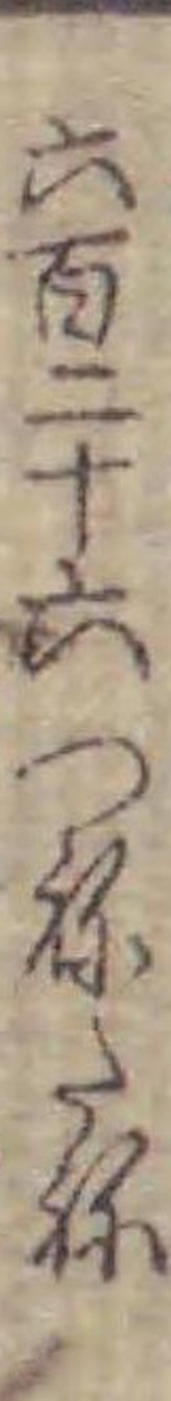六百二十六つねたね
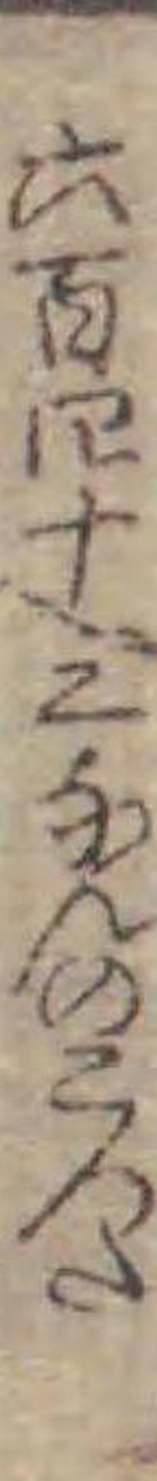六百四十三なんのこつた
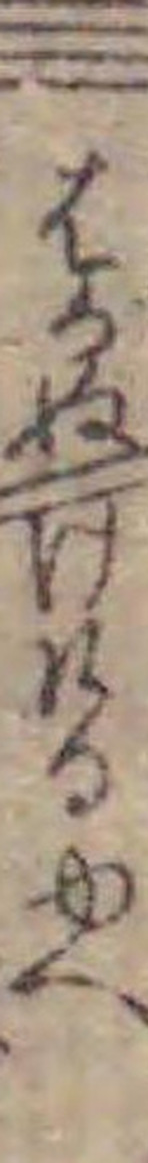はがぬけけるゆへ
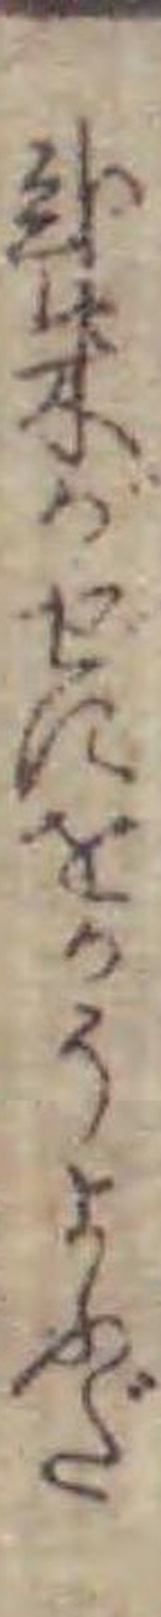弐朱がぜにをかうよふだ
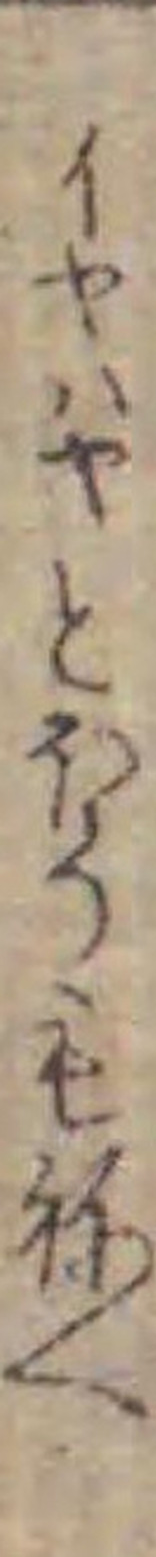イヤハヤとほうもねへ

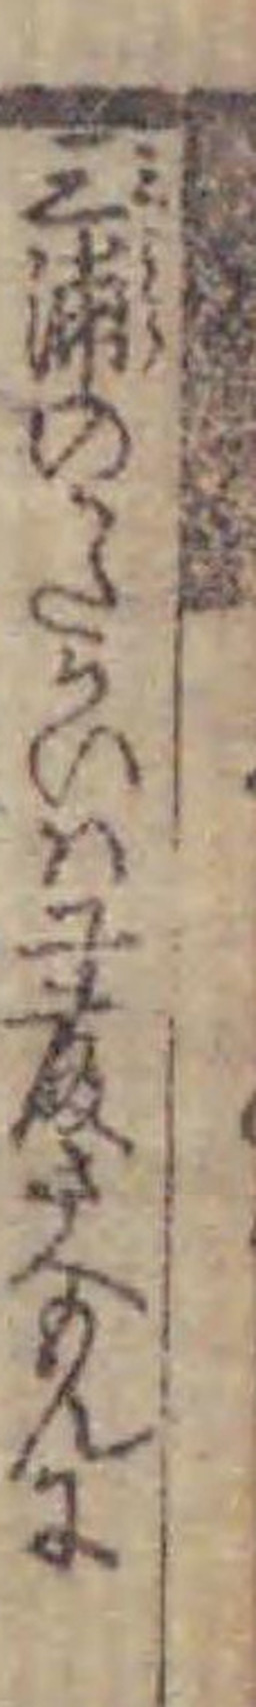三浦のかたかいは工藤さへもんに
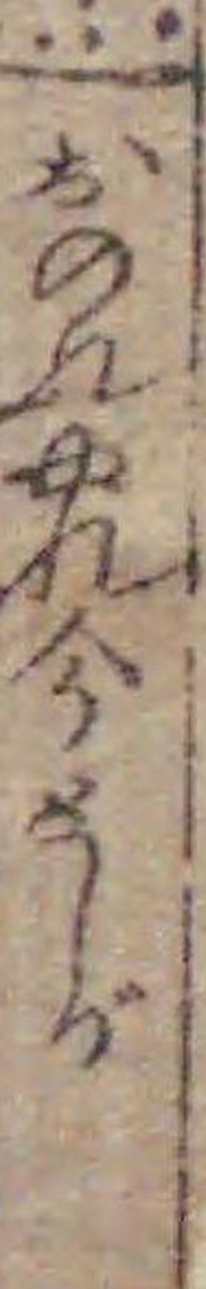おのやれ今としが
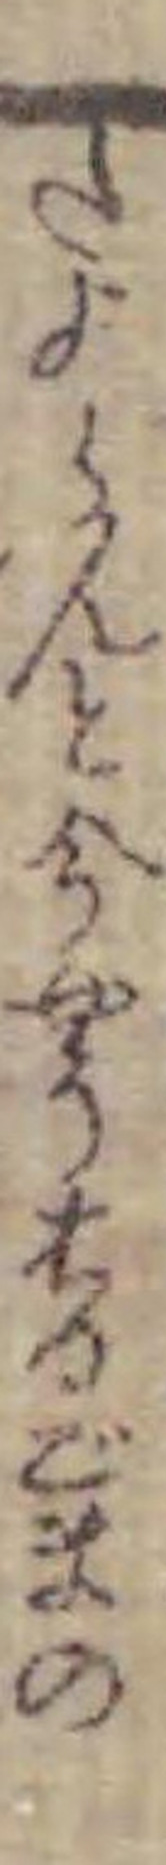たよらんと今やうはるごまの
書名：年寄之冷水曽我 : 3巻
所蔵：国立国会図書館 National Diet Library, JAPAN
